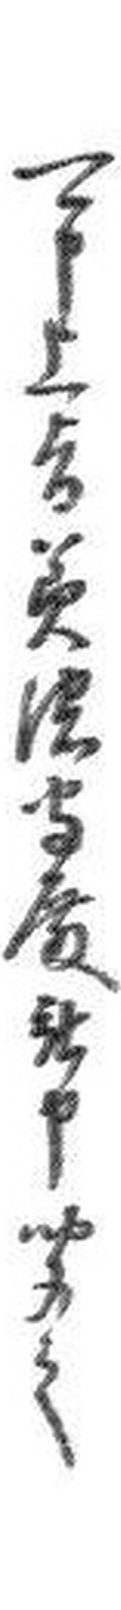可申上旨美濃守殿被申聞之

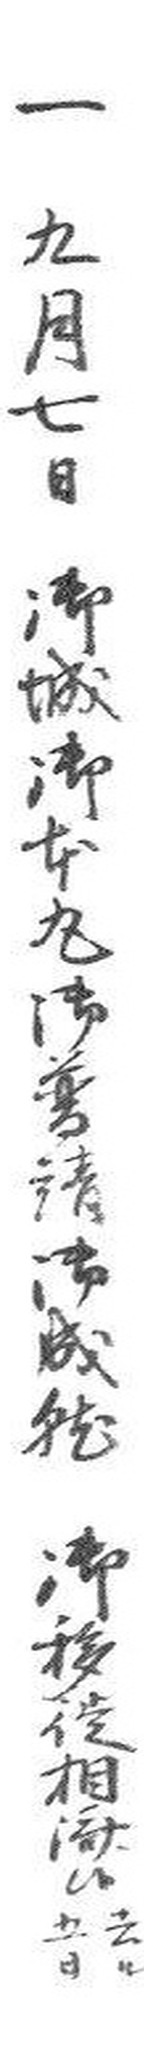一九月七日御城御本丸御普請御成就御移徙相済候去ル五日
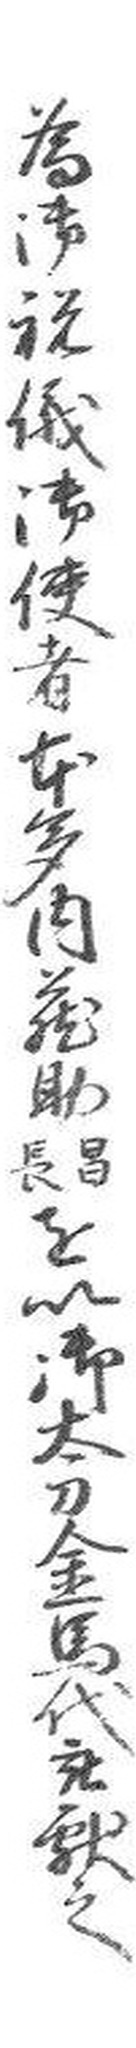為御祝儀御使者本多内蔵助昌長を以御太刀金馬代被献之
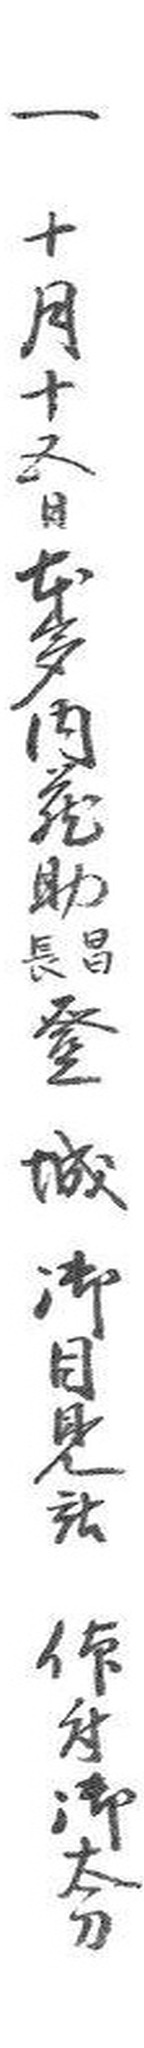一十月十五日本多内蔵助昌長登城御目見被仰付御太刀
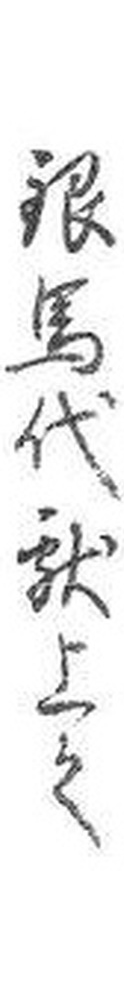銀馬代献上之
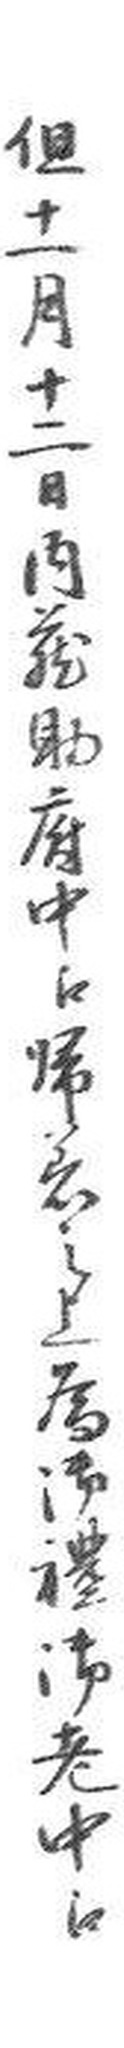但十一月十二日内蔵助府中江帰着之上為御礼御老中江
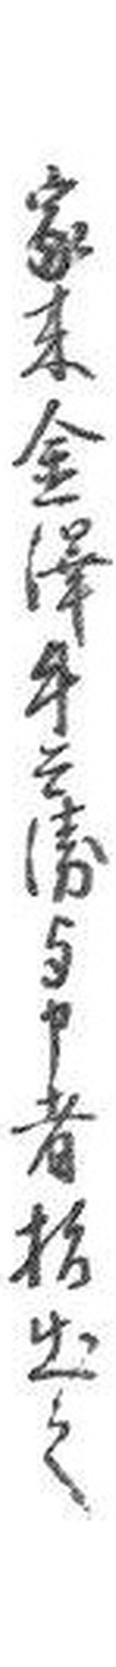家来金沢牛兵衛と申者指出之
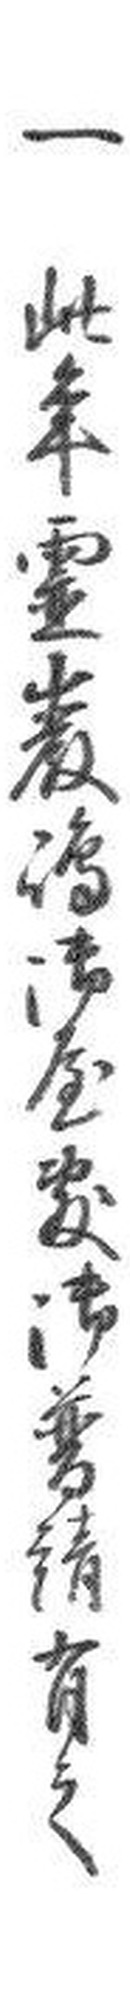一此年霊巌嶋御屋敷御普請有之
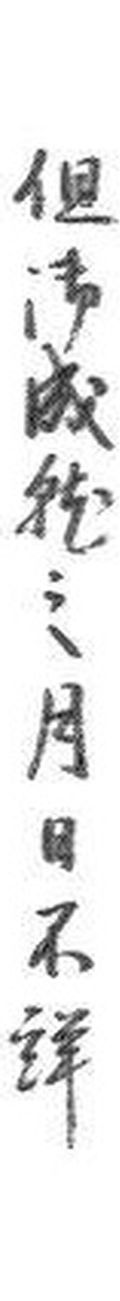但御成就之月日不詳
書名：家譜 五 光通公 従寛永十三年到万治二年
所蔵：福井県文書館 Fukui Prefectural Archives
